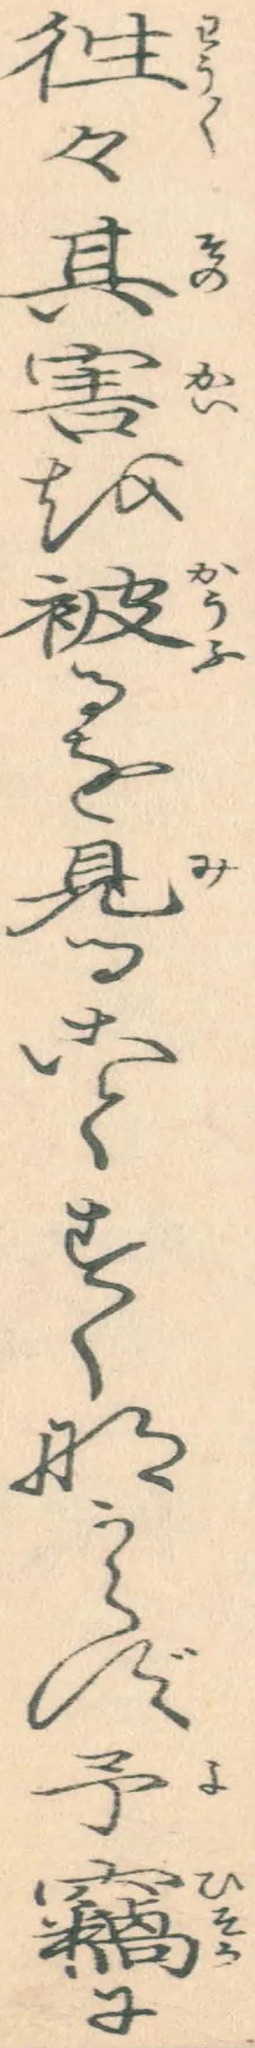往々其害を被るを見ることすくなからず予竊に

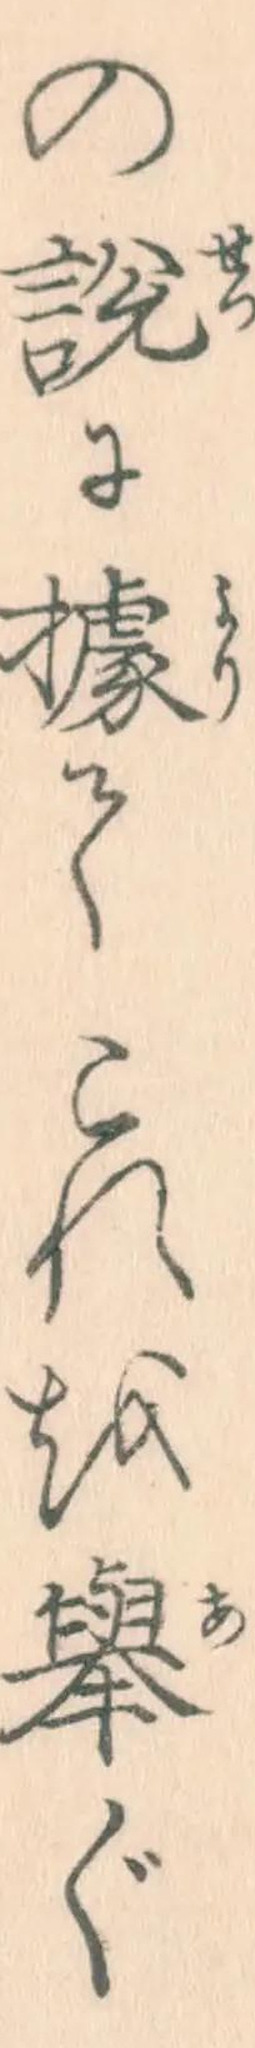の説に拠てこれを挙ぐ
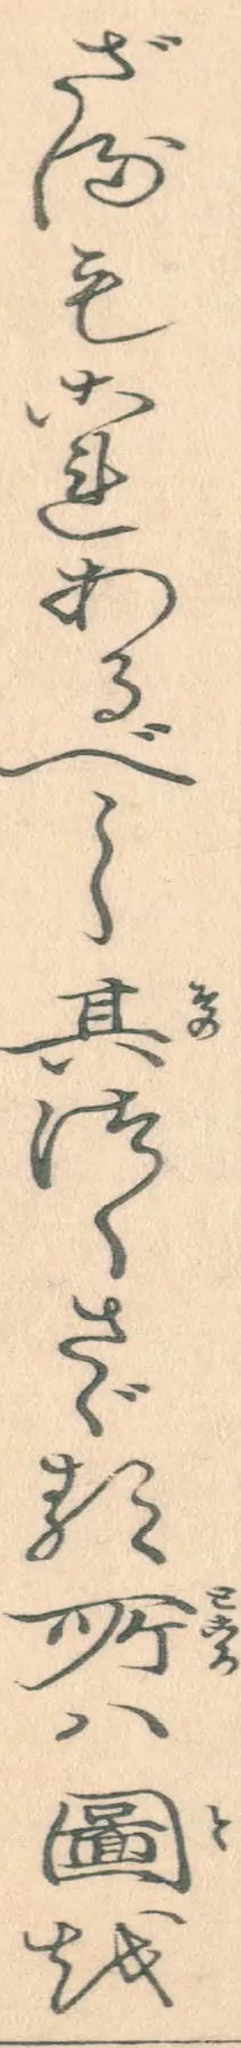ざるもこれあるべし其つくさゞる所は図を
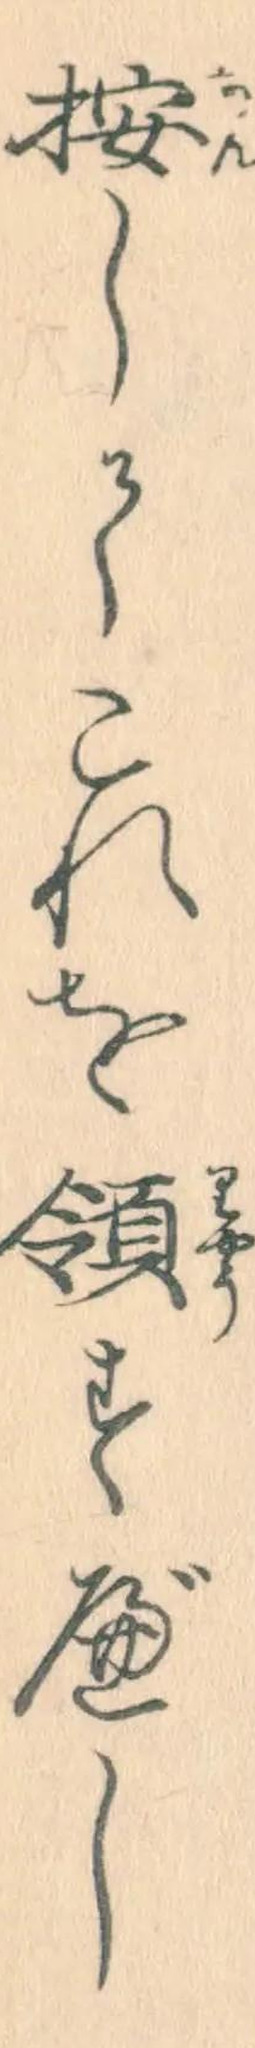按してこれを領すべし

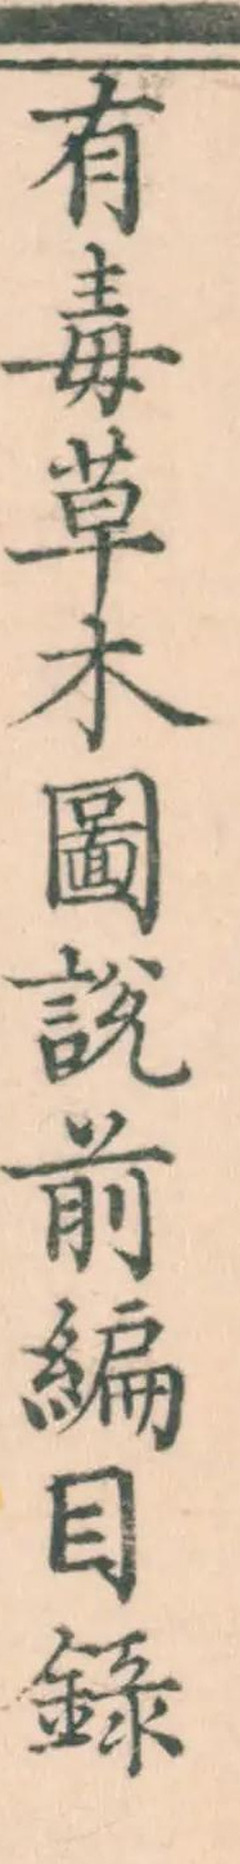有毒草木図説前編目録

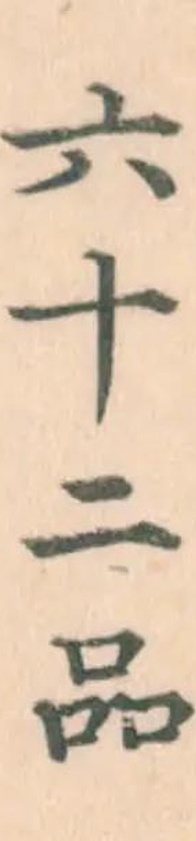六十二品
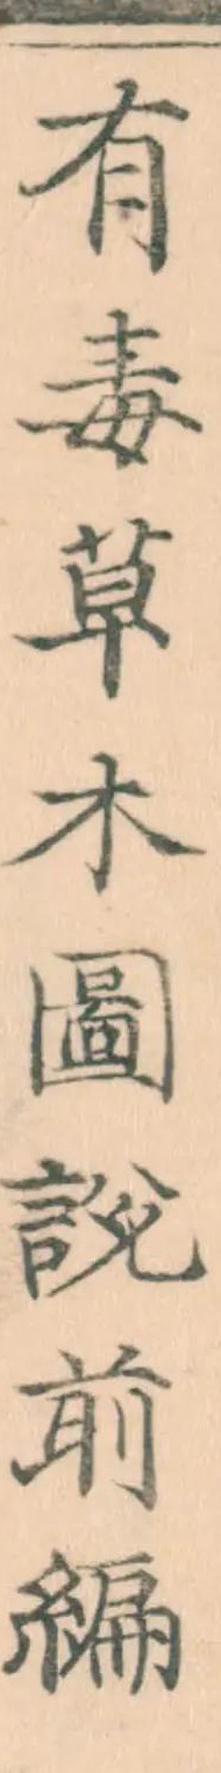有毒草木図説前編
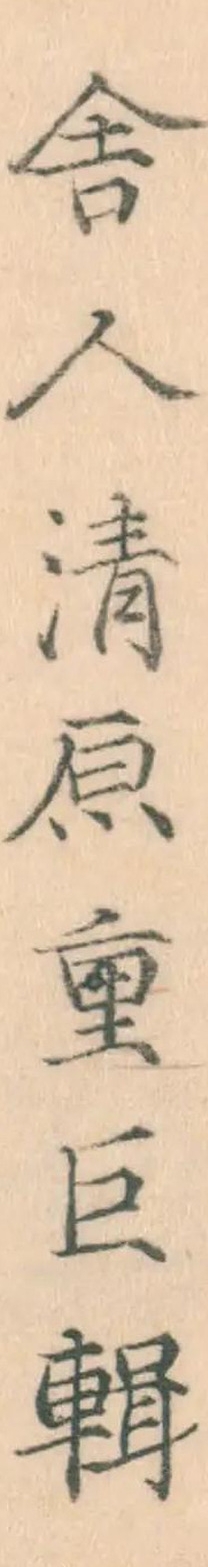舎人清原重巨輯
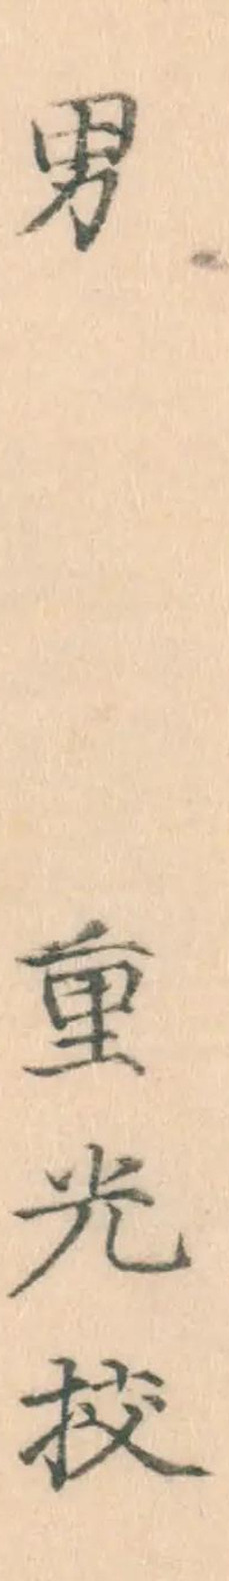男重光校

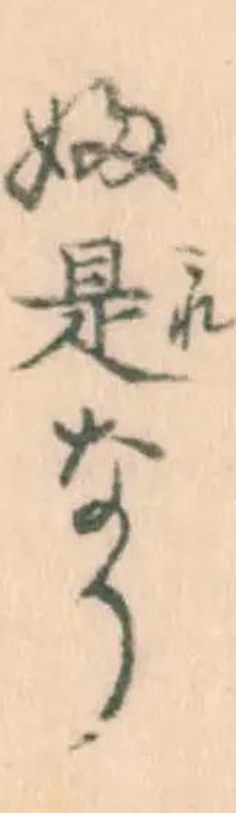ふ是なり

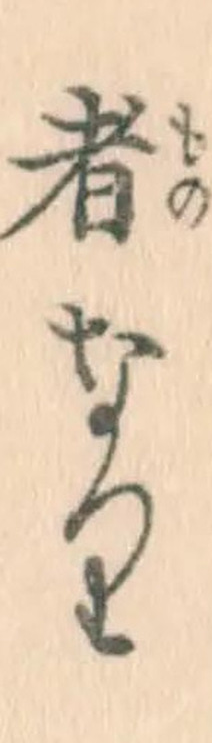者なり

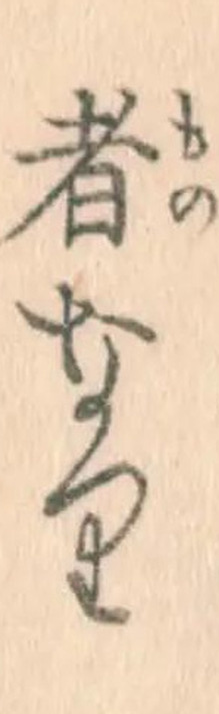者なり
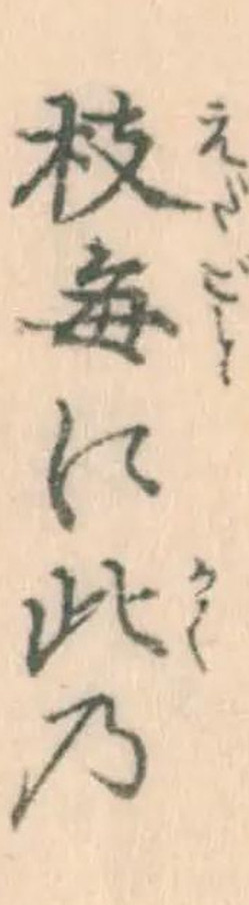枝毎に此の
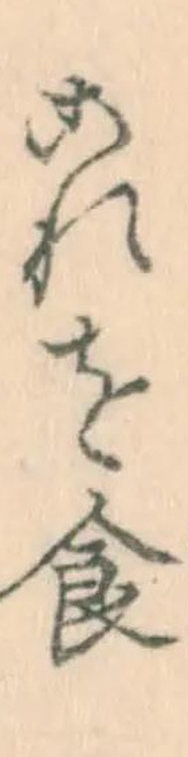これを食
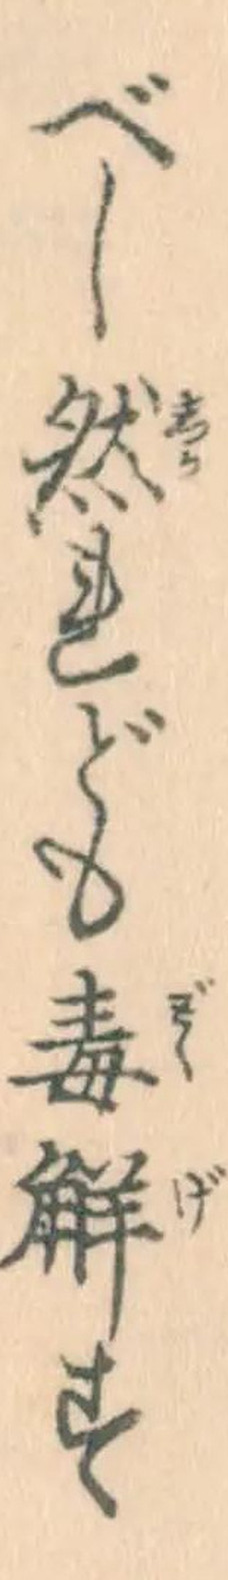べし然れども毒解す
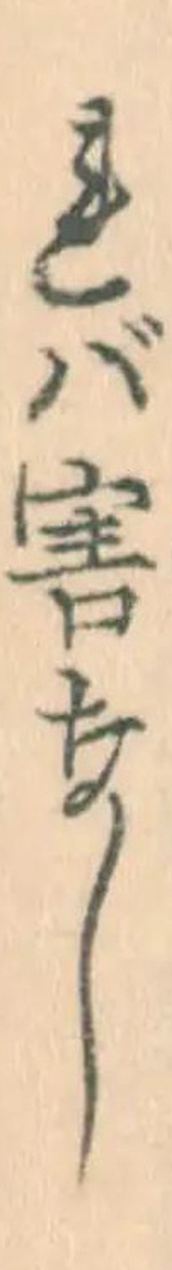れば害なし
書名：有毒草木図説 2巻. [1]
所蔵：国立国会図書館 National Diet Library, JAPAN
